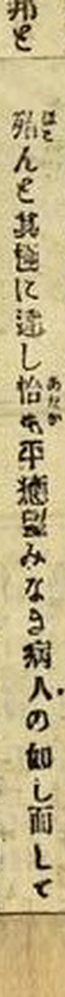殆んと其極に達し恰も平癒望みなき病人の如し而して
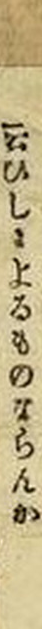云ひしによるものならんか未完
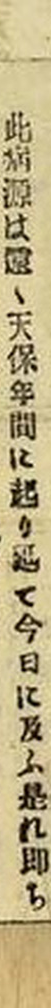此病源は遠く天保年間に起り延て今日に及ふ是れ即ち
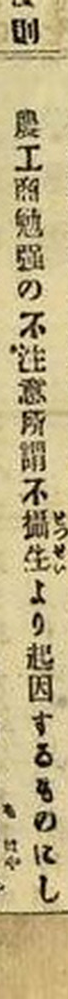農工商勉強の不注意所謂不摂生より起因するものにし
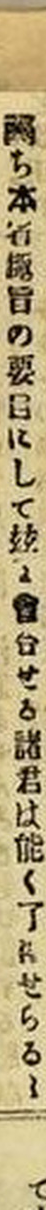ち本省趣旨の要目にして茲に会合せる諸君は能く了せらるゝ
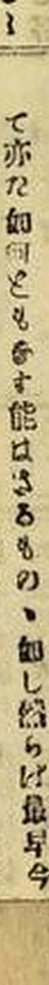て亦た如何ともなす能はさるものゝ如し然らば最早今
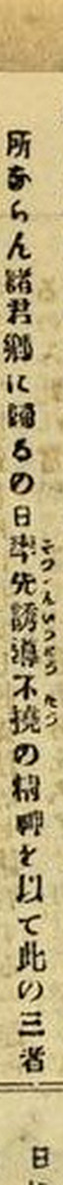所ならん諸君郷に帰るの日率先誘導不撓の精神を以て此の三者
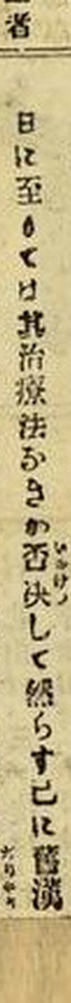日に至りては其治療法なきか否決して然らす已に旧漢
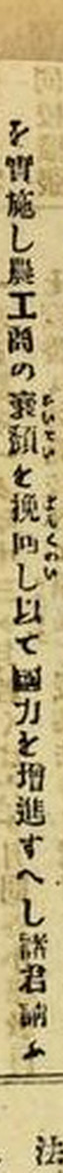を実施し農工商の衰頽を挽回し以て国力を増進すへし諸君請ふ
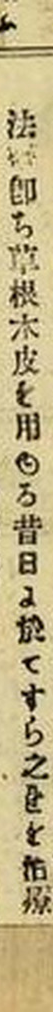法即ち草根木皮を用ゆる昔日に於てすら之れを治療
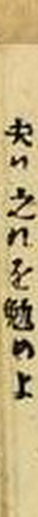夫れ之れを勉めよ
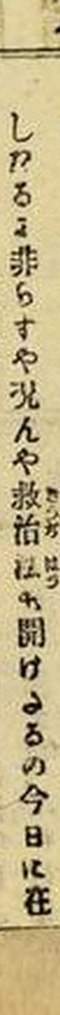したるに非らすや況んや救治法開けたるの今日に在
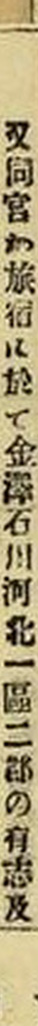又同官か旅宿に於て金沢石川河北一区二郡の有志及
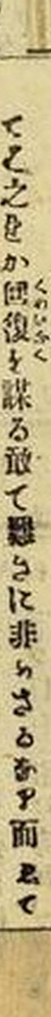ては之れか回復を謀る敢て難きに非らさるなり而して
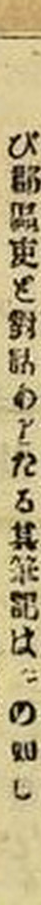び郡県吏と対話ありたる其筆記は左の如し
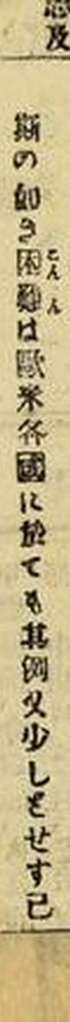斯の如き困難は欧米各国に於ても其例又少しとせす已
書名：温古集 五巻
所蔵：福井県文書館 Fukui Prefectural Archives
